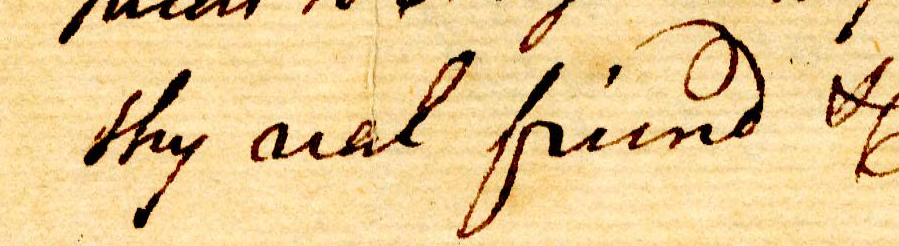thy real friend &c
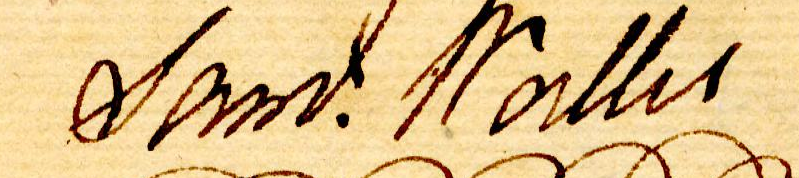Sam^l. Wallis
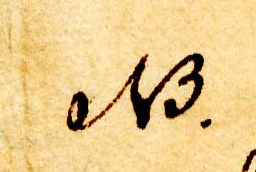NB.
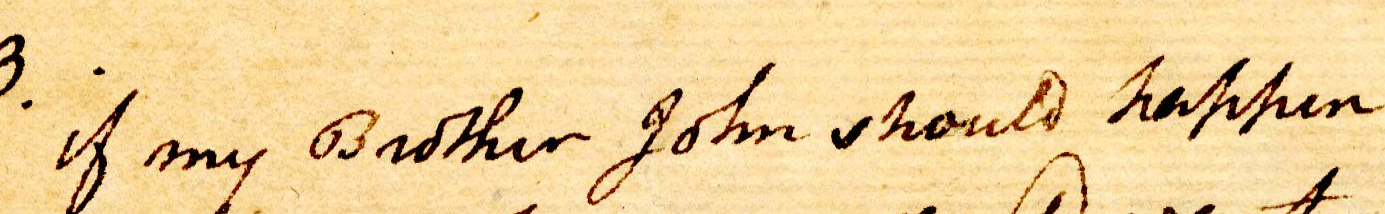if my Brother John should happen
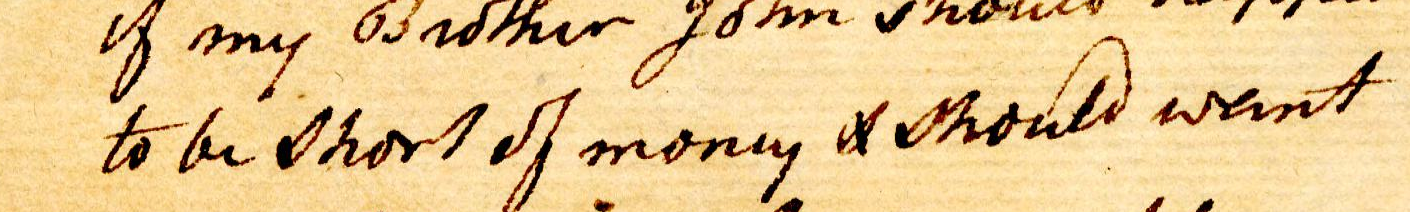to be short of money & should want
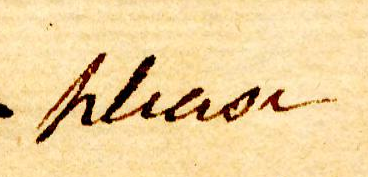please
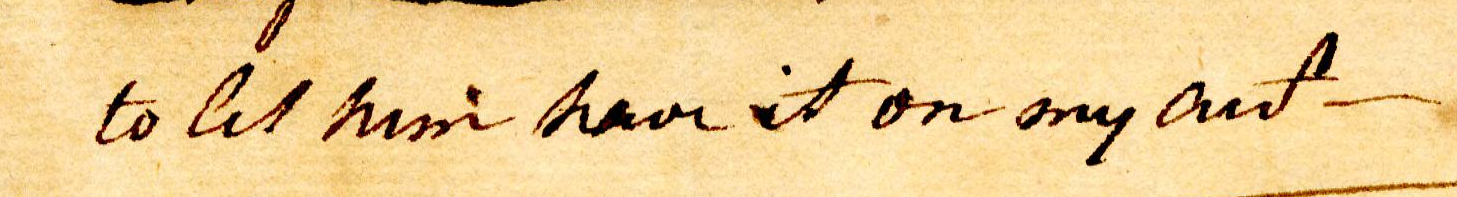to let him have it on my acc^t-
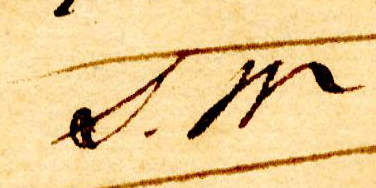S. W
